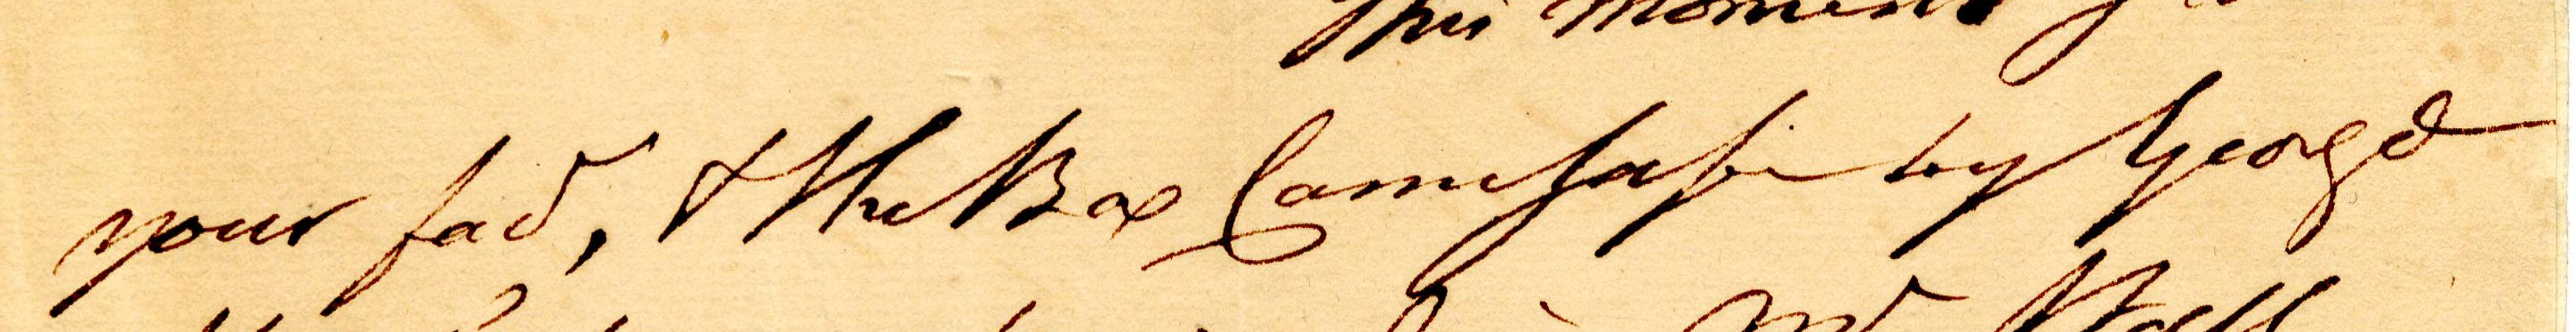your fav^r, & the Box Comisap came safe by George
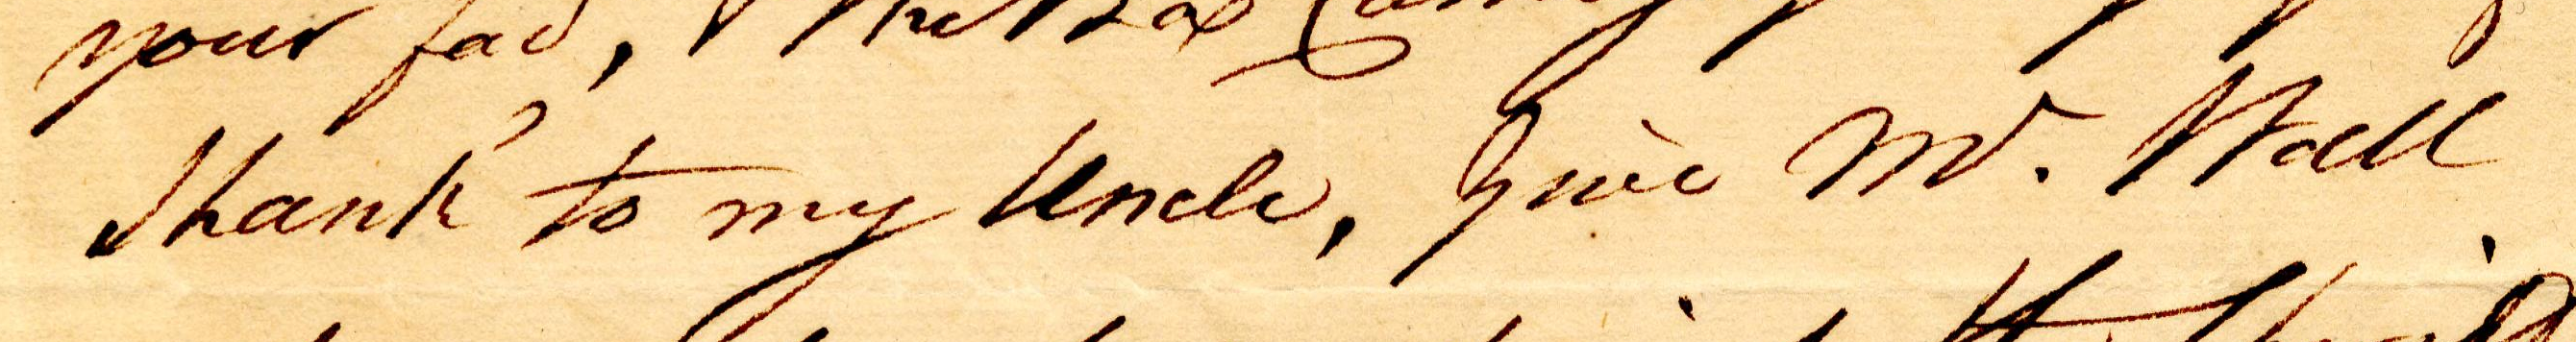Shank to my Uncle, Give M^r. Wall
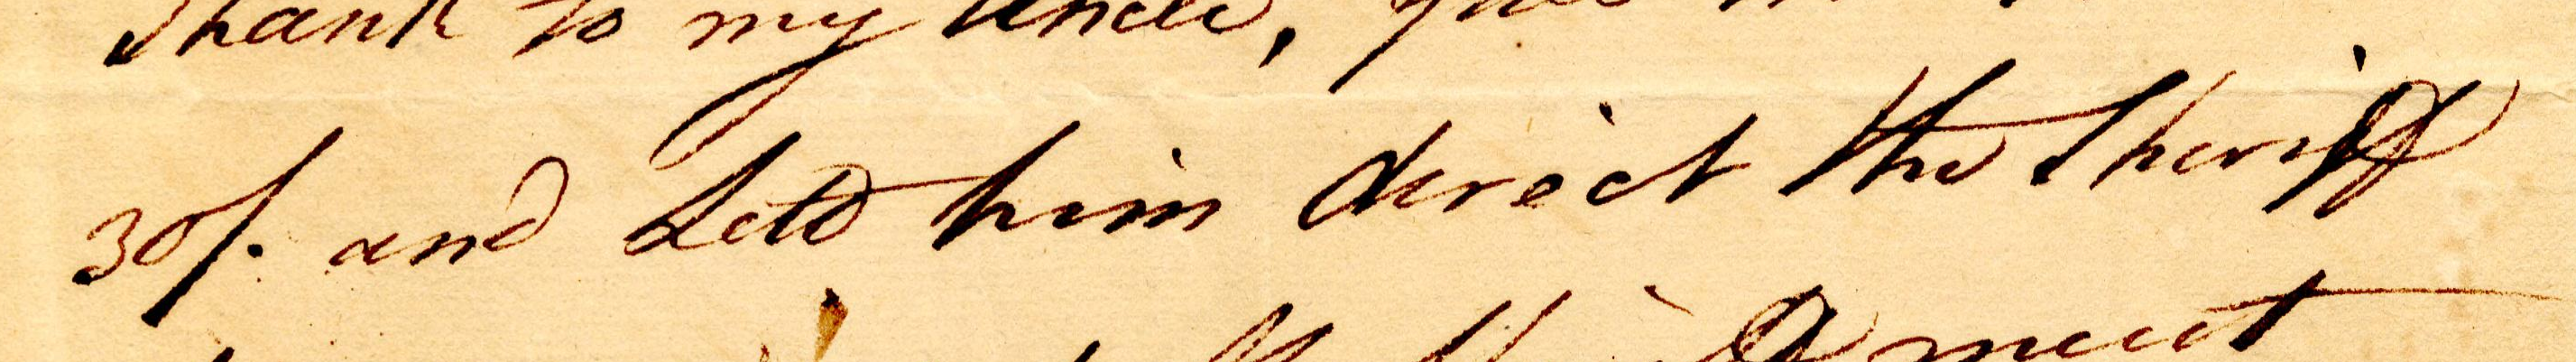30s. and Lett him direct the Sheriff
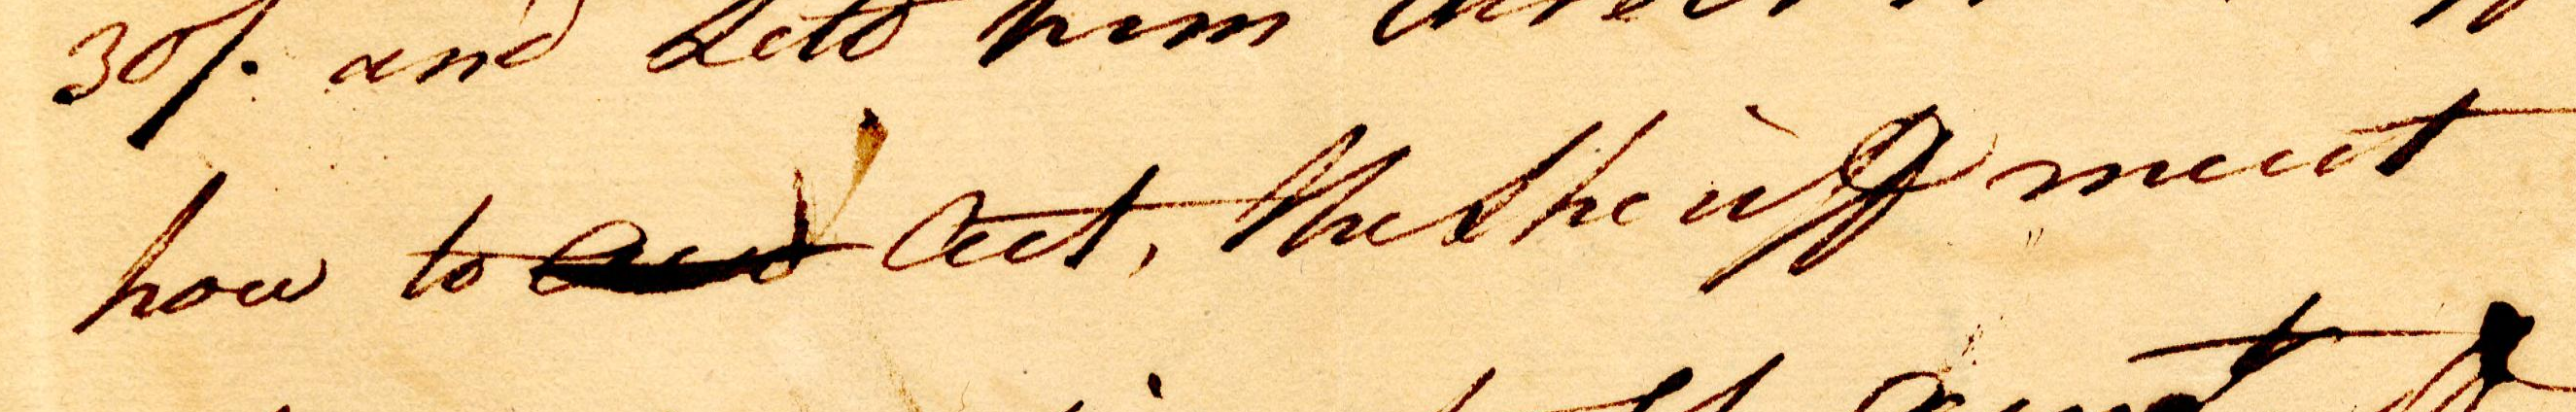how to [Acct] Act, that he in & meet
